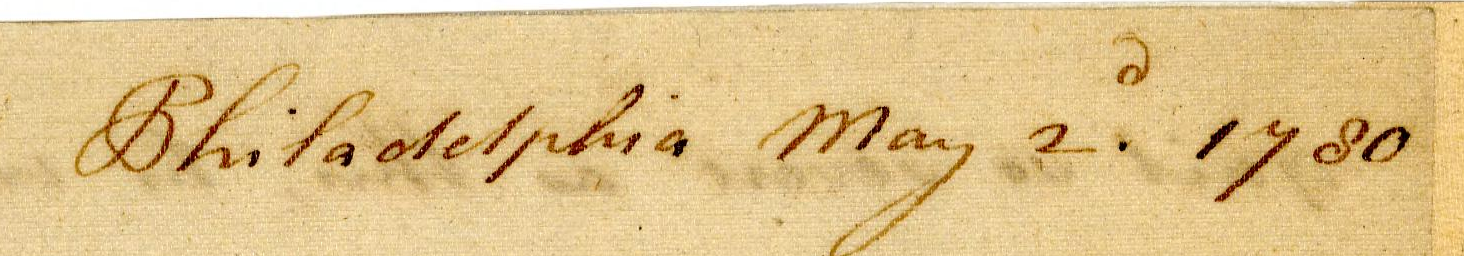Philadelphia May 2^d. 1780
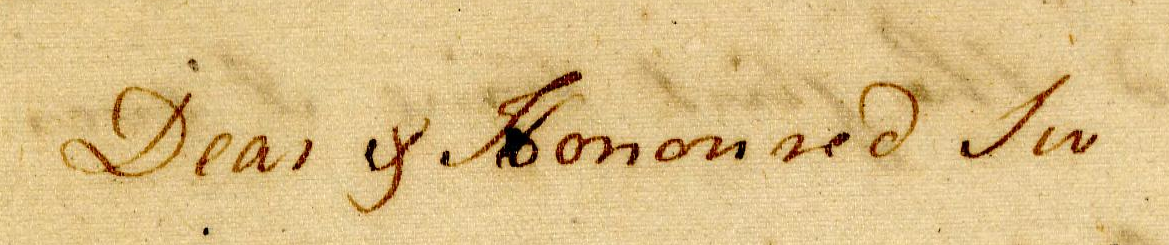Dear & Honoured Sir
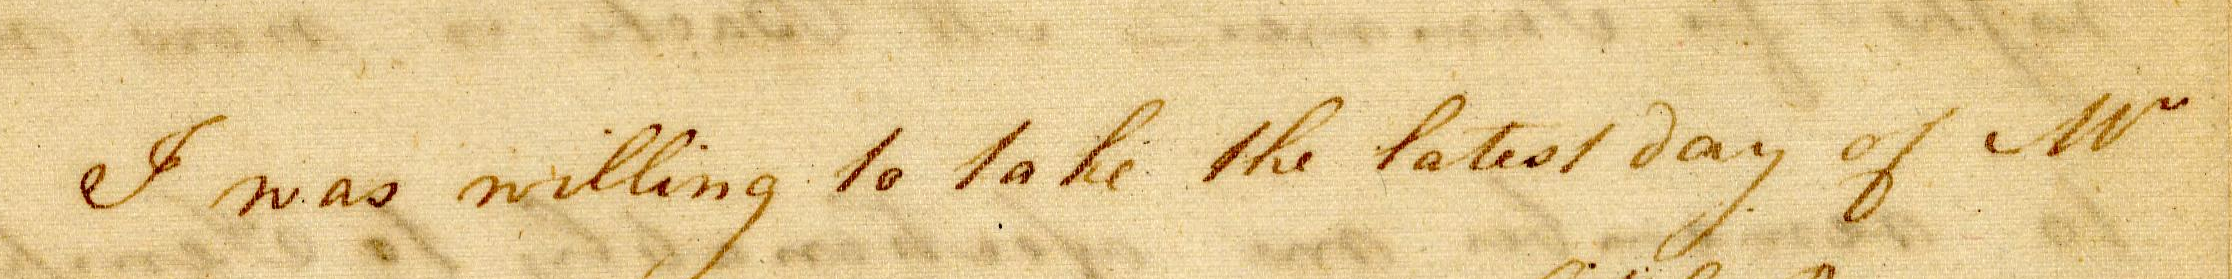I was willing to take the latest day of M^r
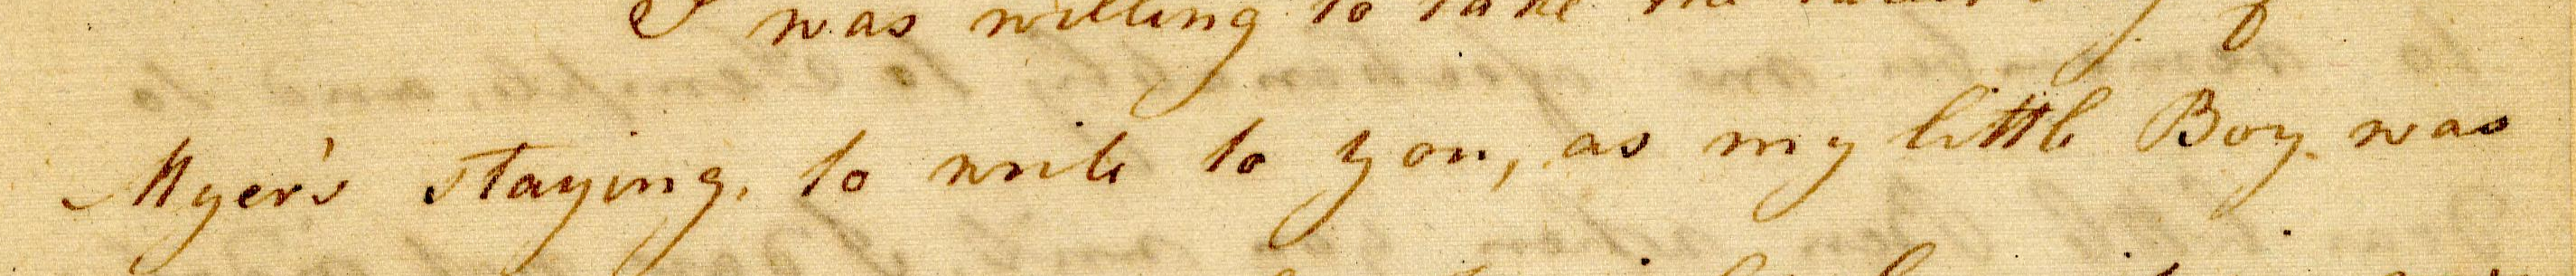Myer's staying, to write to you, as my little Boy was
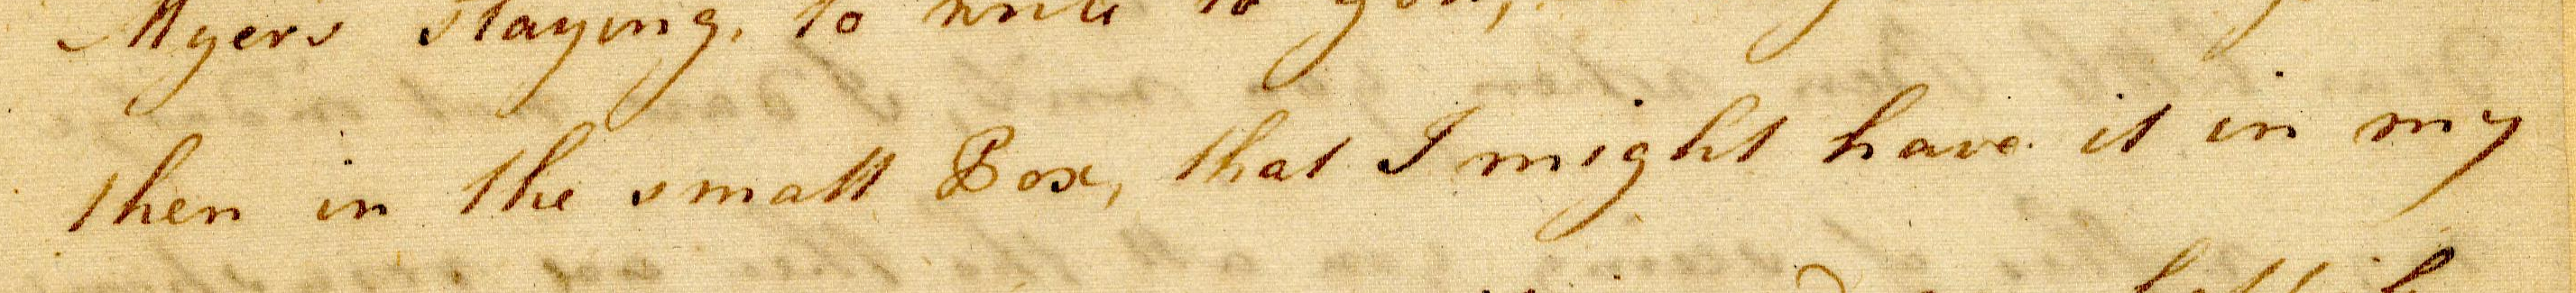then in the small Pox, that I might have it in my
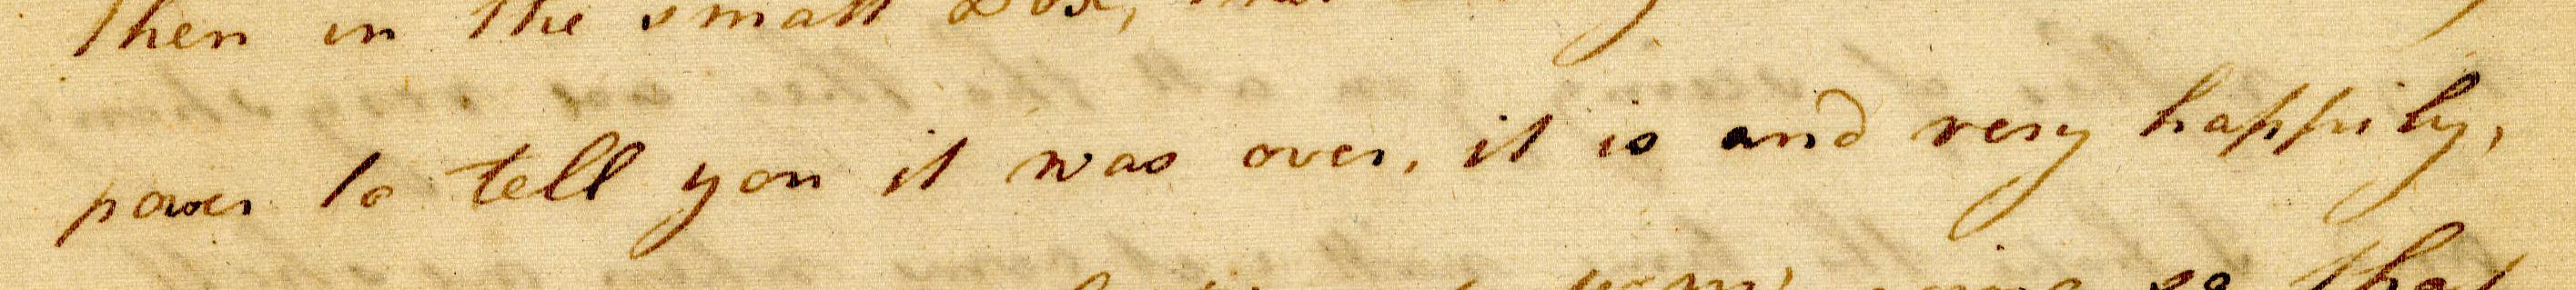power to tell you it was over, it is and very happily,
